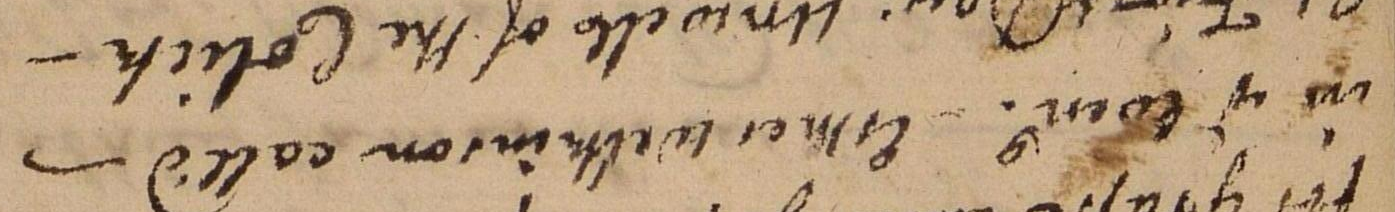in y^e Even^g. - Esther Wilkinson call'd-
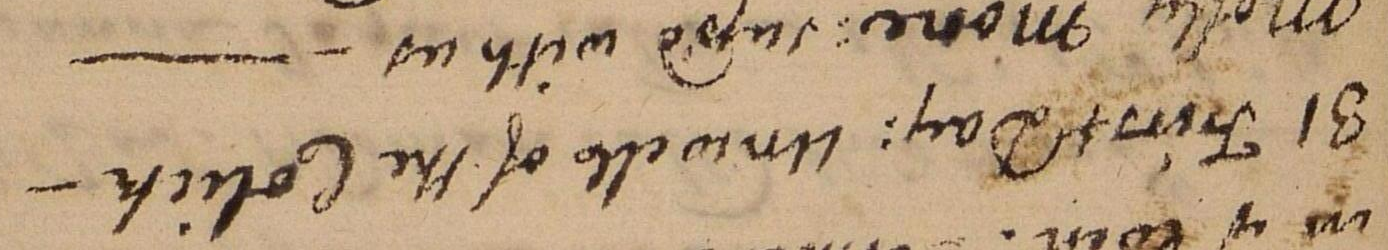31 First Day: Unwell of the Colick-
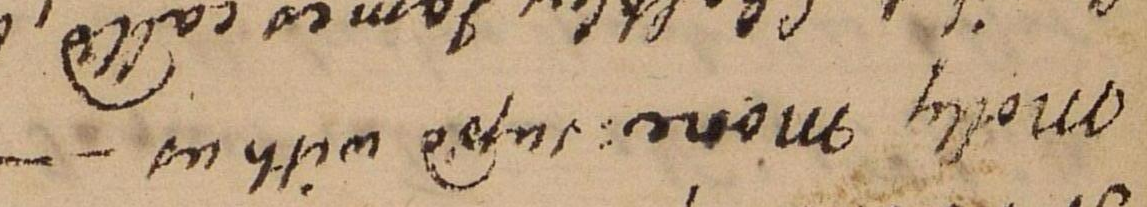Molly Mane sup'd with us-
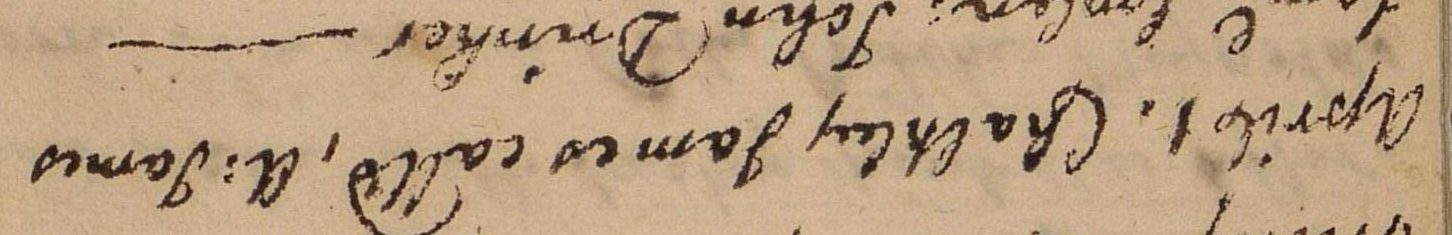April 1. Chalkley James call'd, A: James
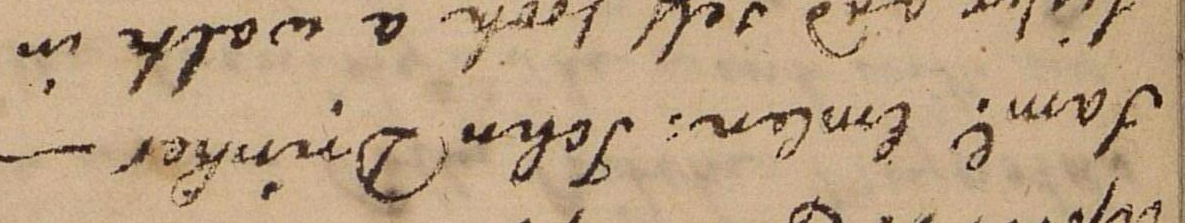Sam^l. Emlen, John Drinker -
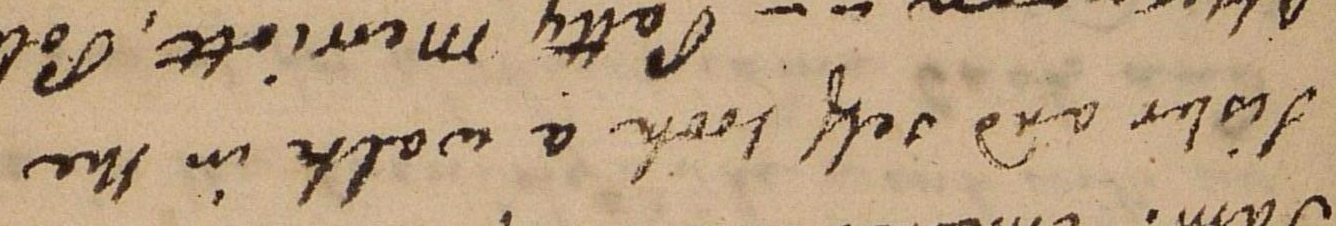Sister and self took a walk in the
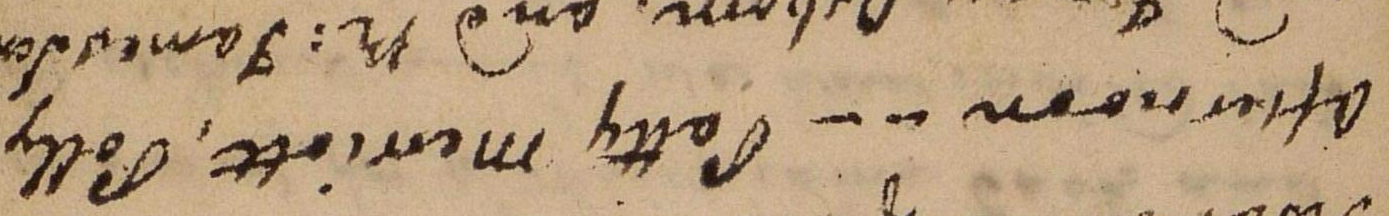Afternoon-- Patty Marriott, Polly
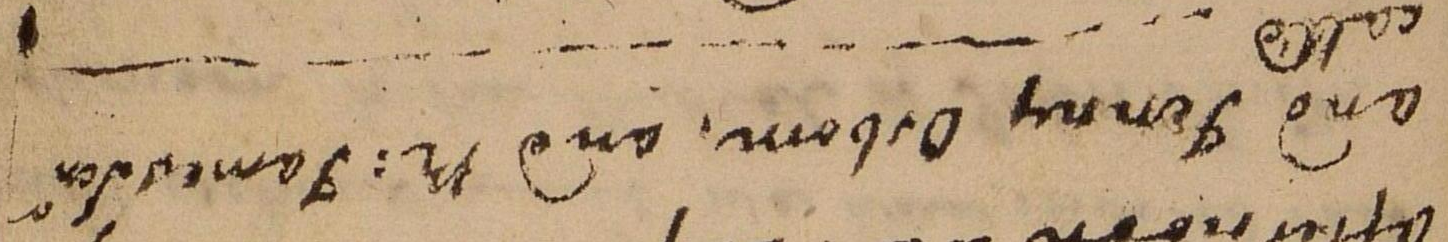and Jonny Osborn, and R. James son
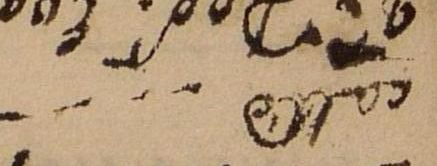call'd-
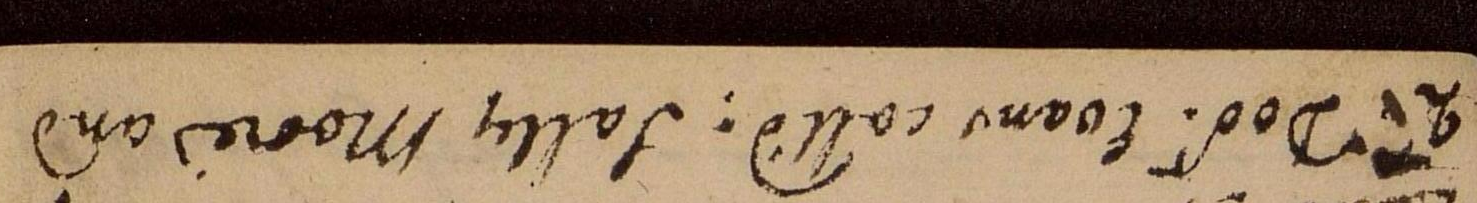2^[_]. Doc^r. Evans call'd: Sally Morris and
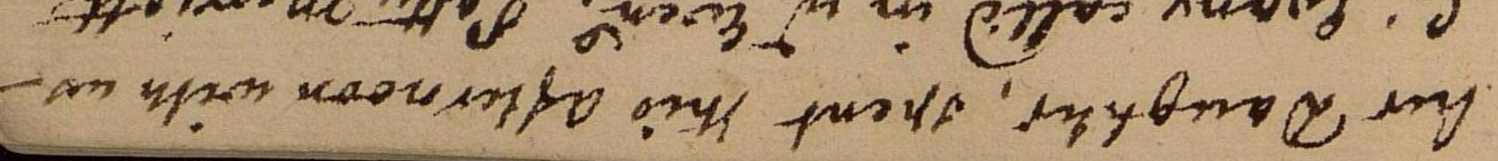her Daugther, spent this Afternoon with us-
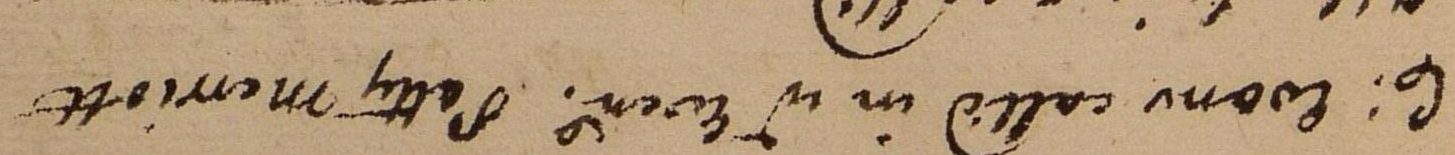6: Evans call'd in y^e Even^g. Patty Merriott
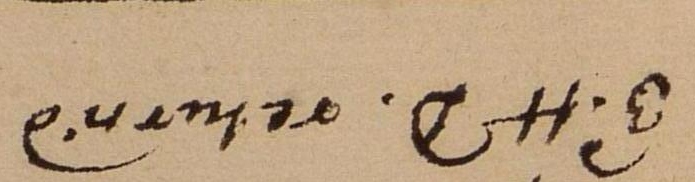3^d. HD. return'd
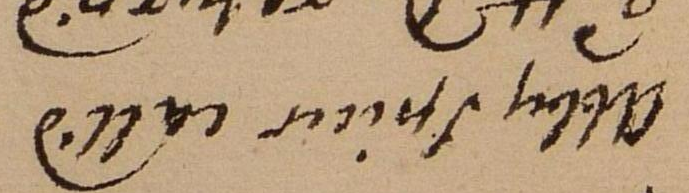Abby Spicer call'd-
